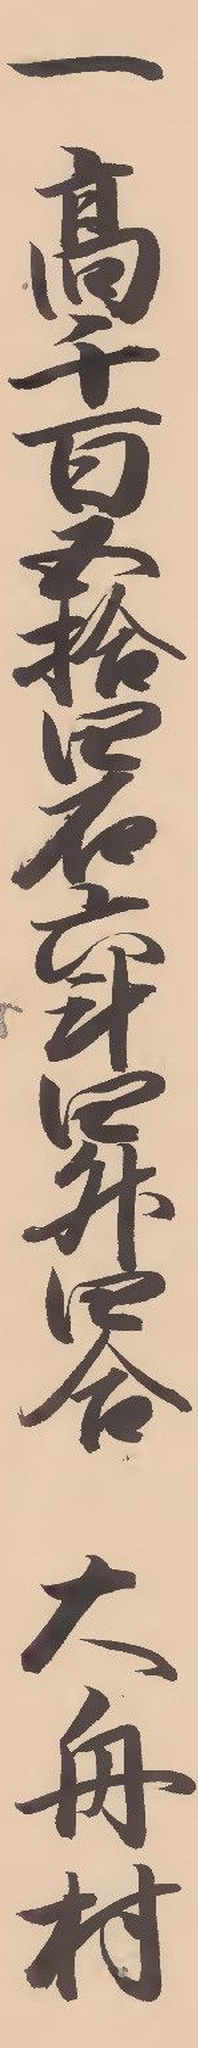一高千百五拾四石六斗四升四合大舟村

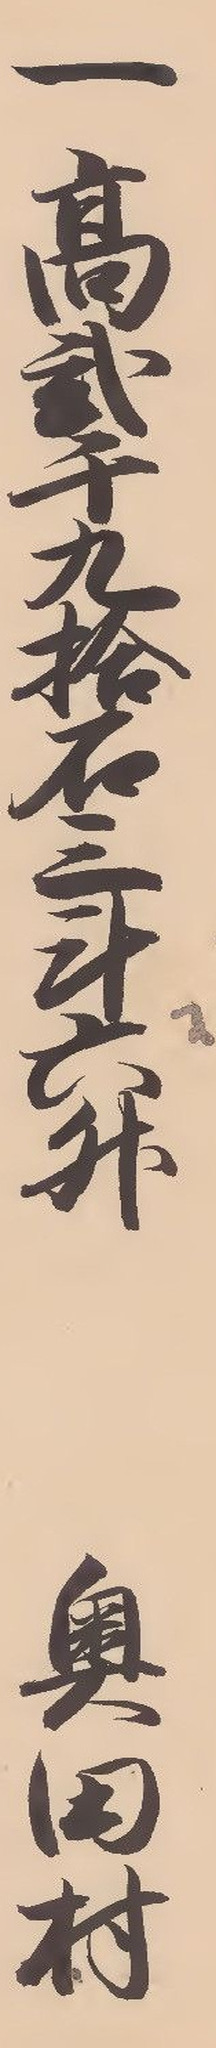一高弐千九拾石三斗六升奥田村
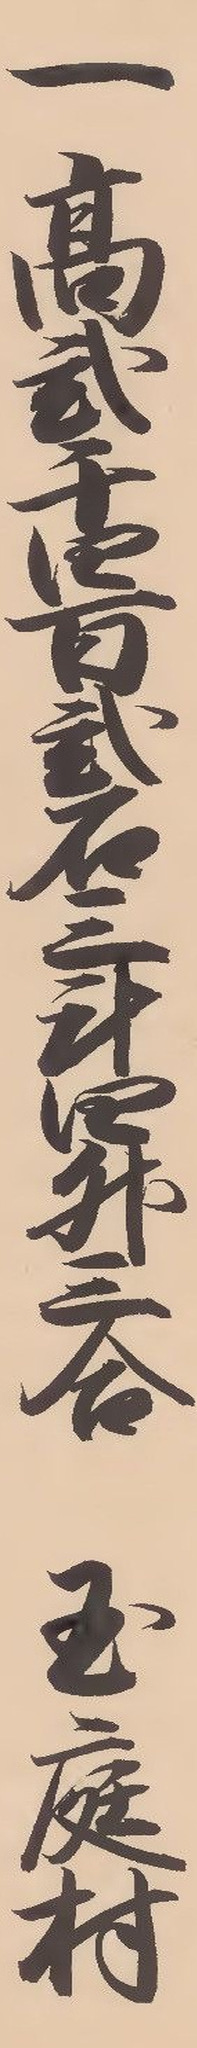一高弐千四百弐石三斗四升三合玉庭村
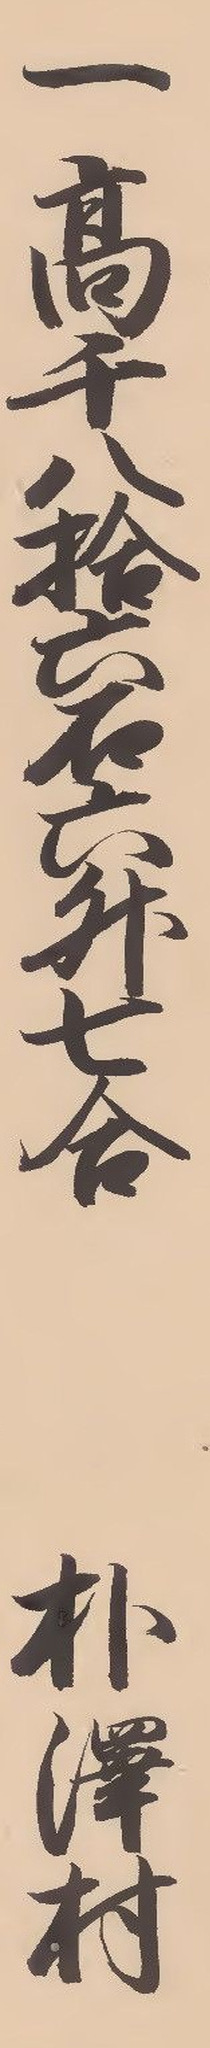一高千八拾六石六升七合朴沢村
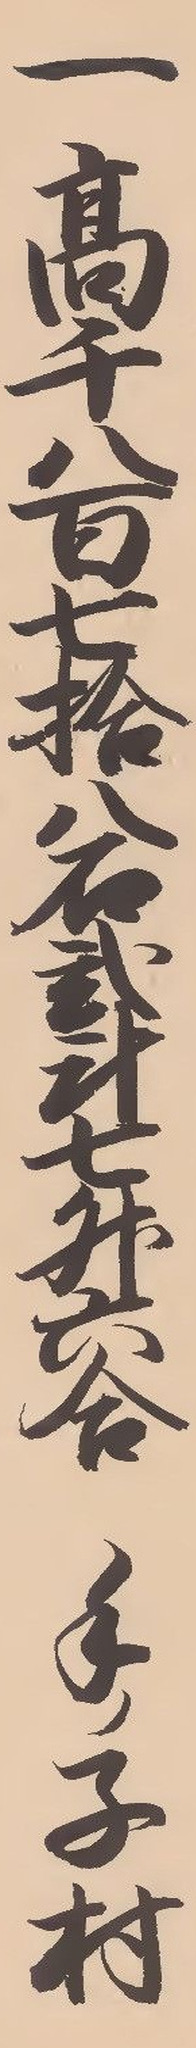一高千八百七拾八石弐斗七升六合手ノ子村
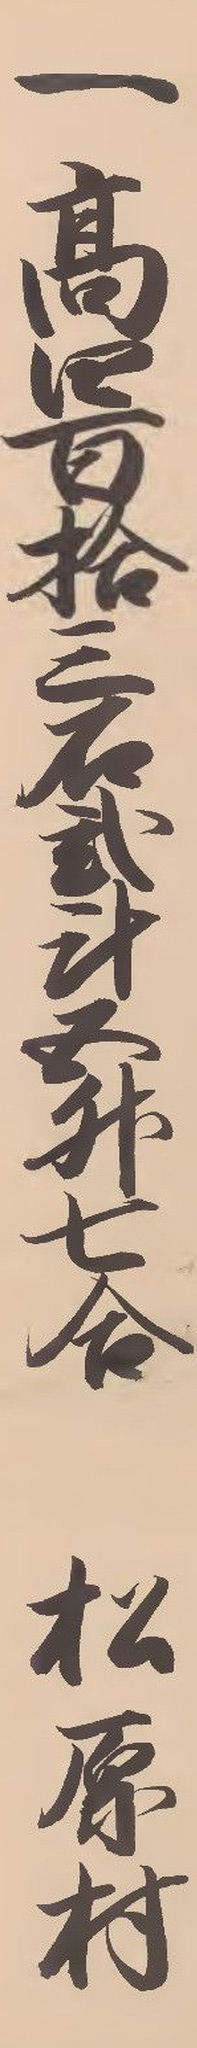一高四百拾三石弐斗五升七合松原村
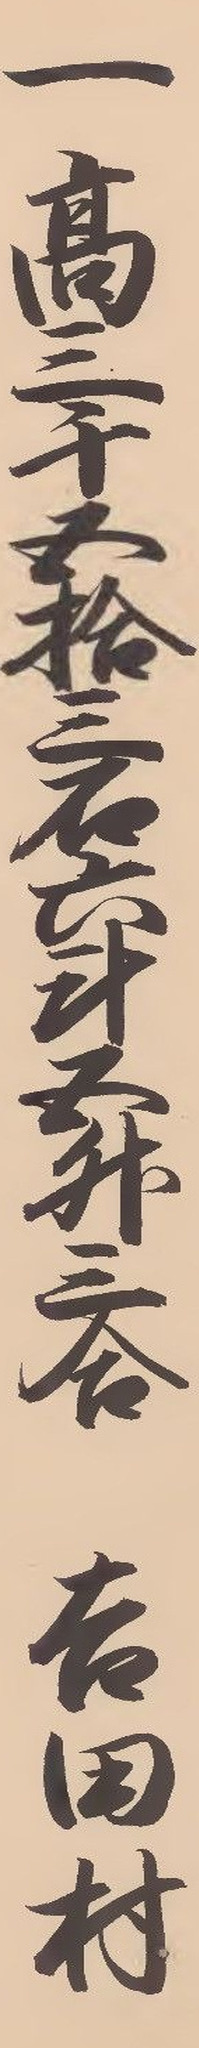一高三千五拾三石六斗五升三合吉田村
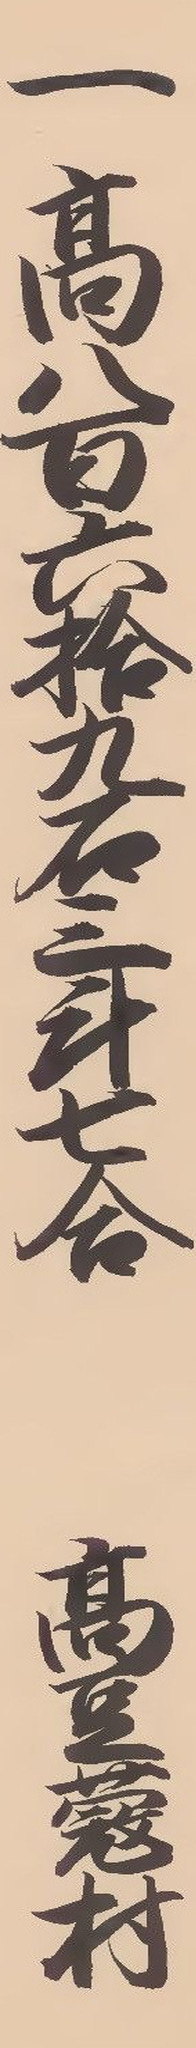一高八百六拾九石三斗七合高豆蔲村
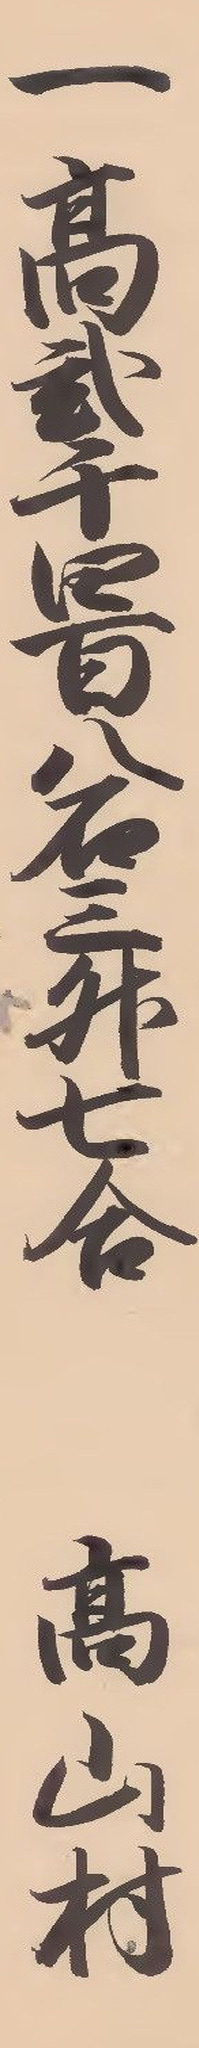一高弐千四百八石三升七合高山村

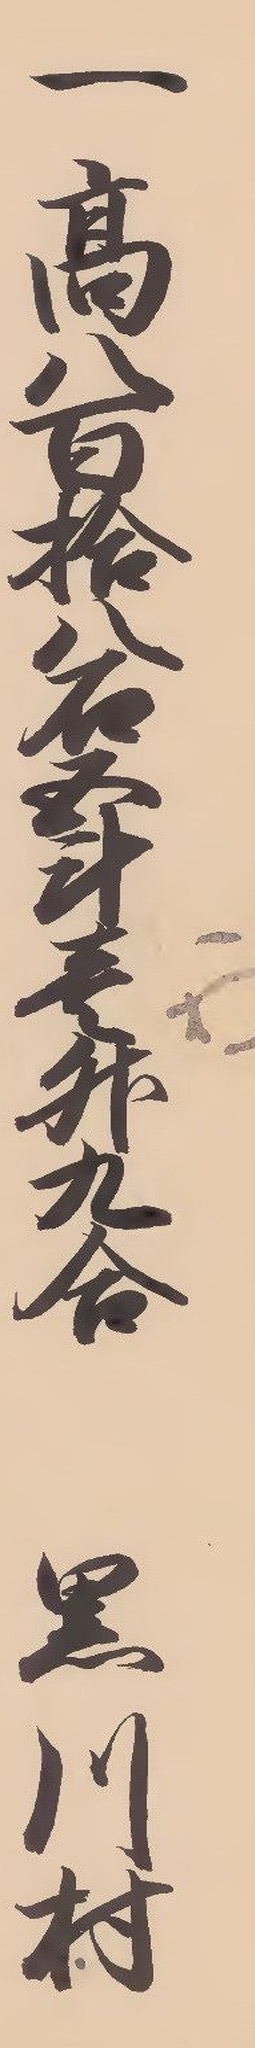一高八百拾八石五斗壱升九合黒川村
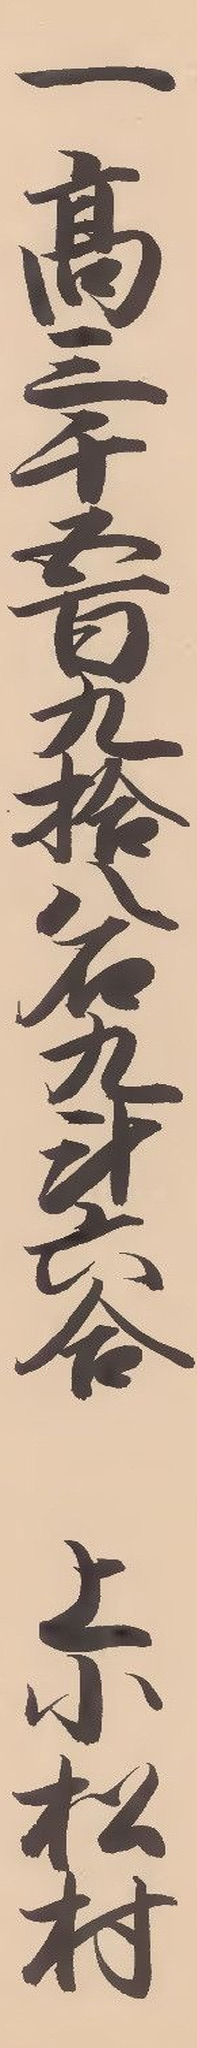一高三千五百九拾八石九斗六合上小松村
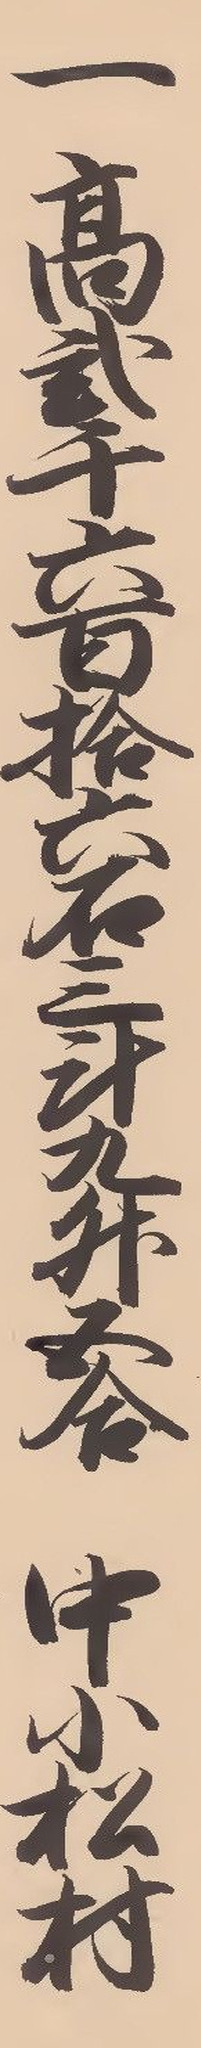一高弐千六百拾六石三斗九升五合中小松村
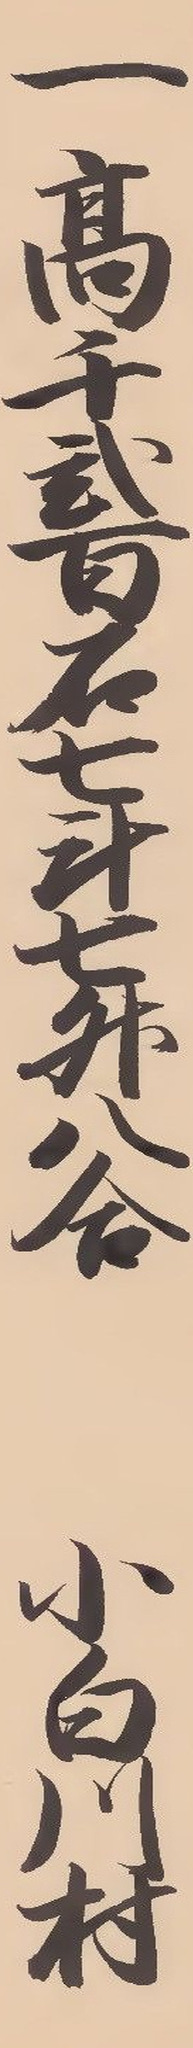一高千弐百石七斗七升八合小白川村
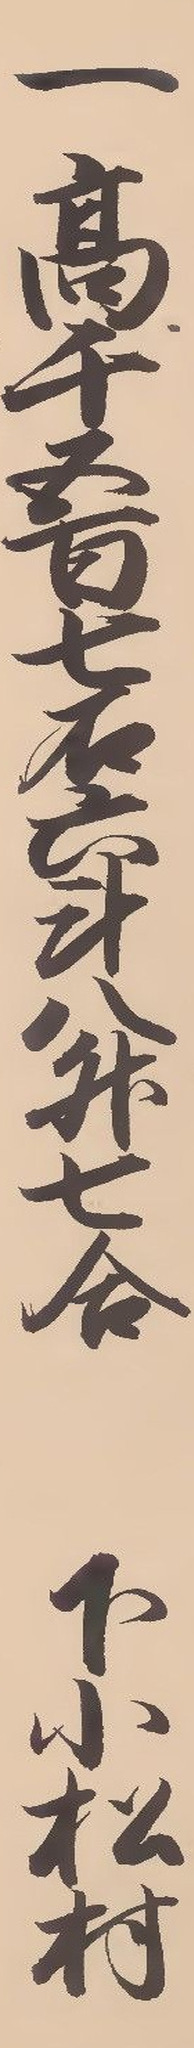一高千五百七石六斗八升七合下小松村
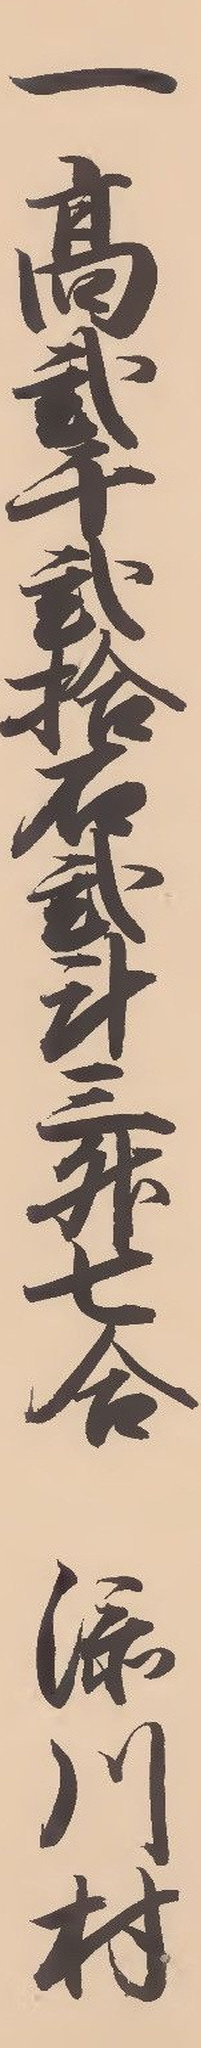一高弐千弐拾石弐斗三升七合添川村
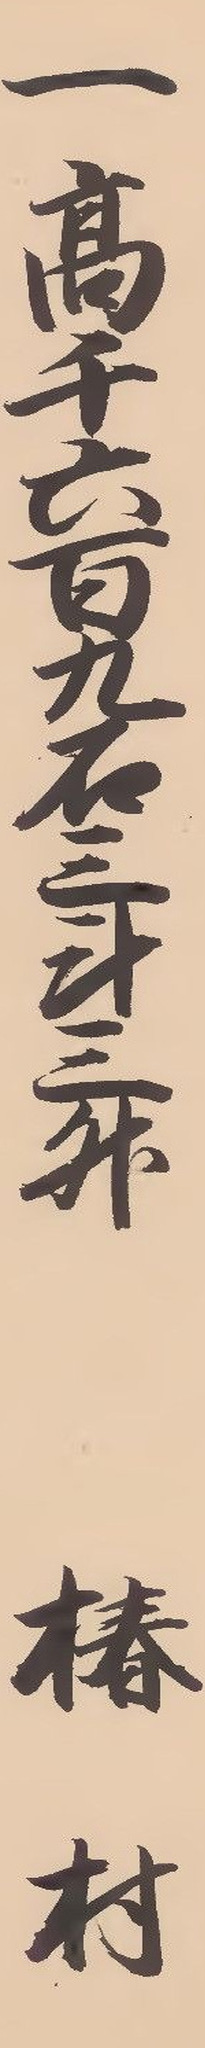一高千六百九石三斗三升椿村
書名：出羽国郷帳　１
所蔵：国立公文書館 National Archives of Japan
